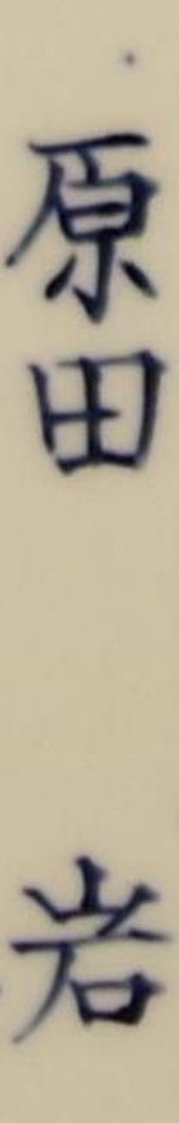原田岩
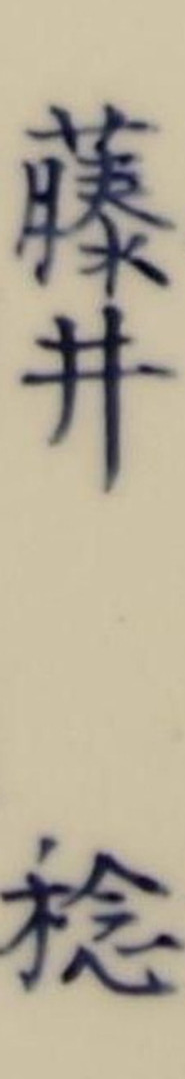藤井稔
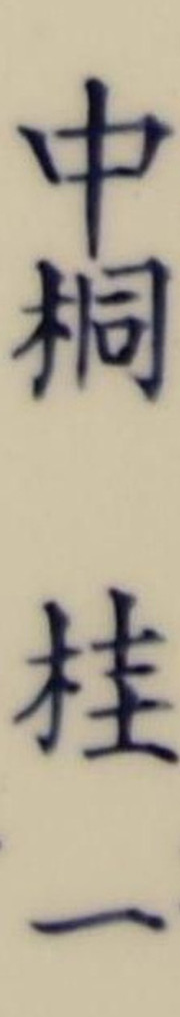中桐桂一
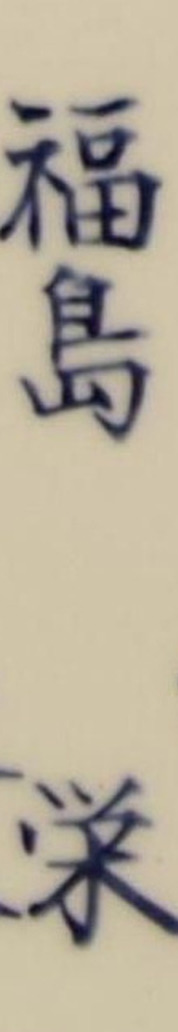福島栄
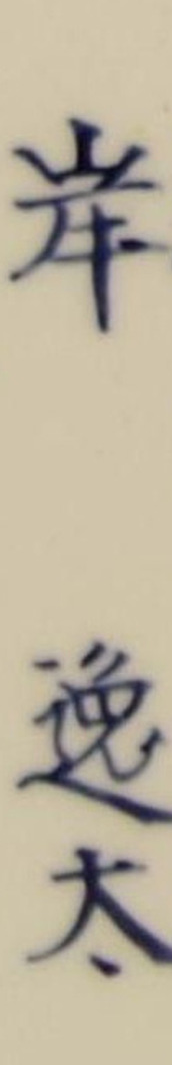岸逸太
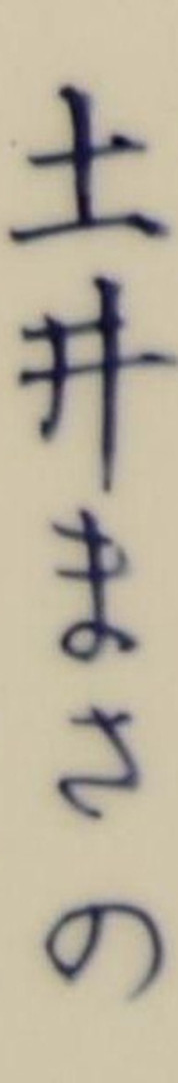土井まさの
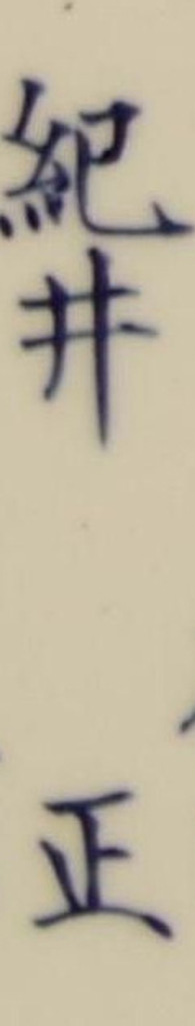紀井正
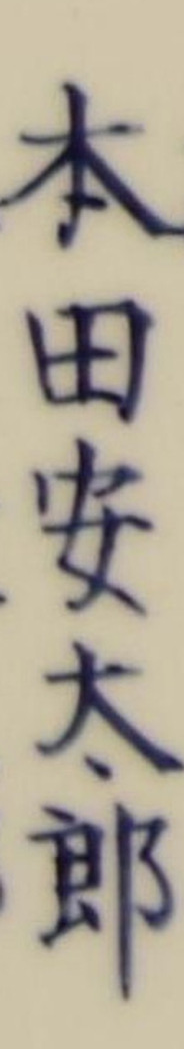本田安太郎
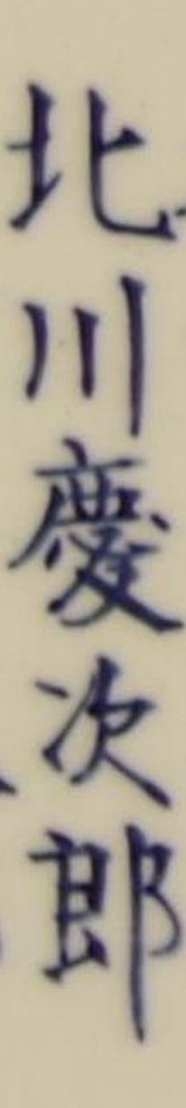北川慶次郎
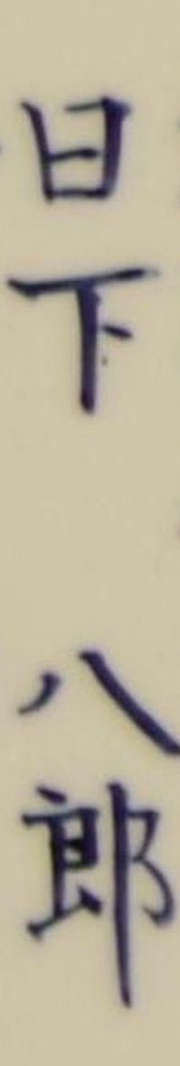日下八郎
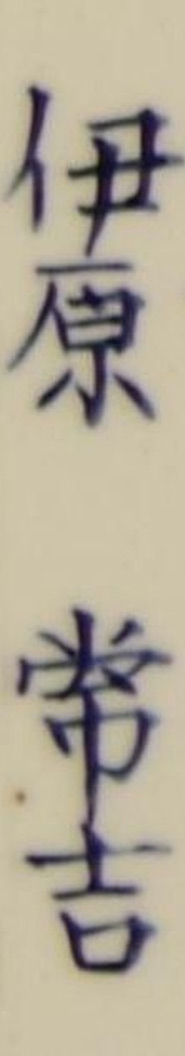伊原常吉

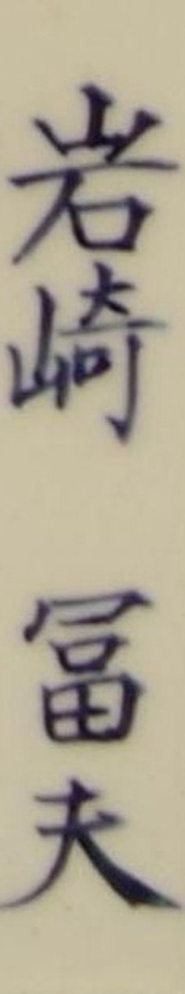岩崎冨夫
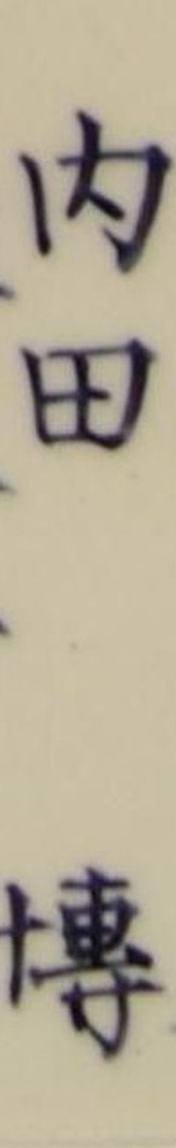内田博
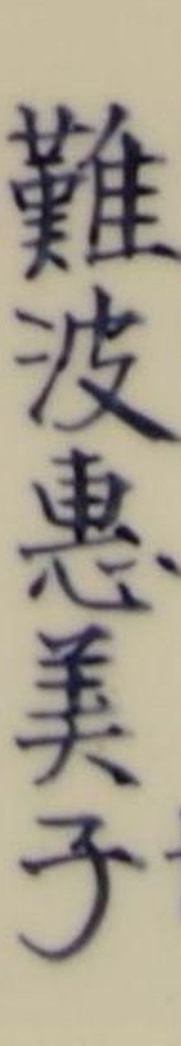難波恵美子
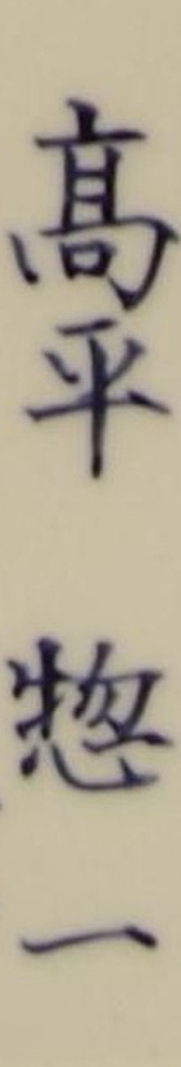高平惣一
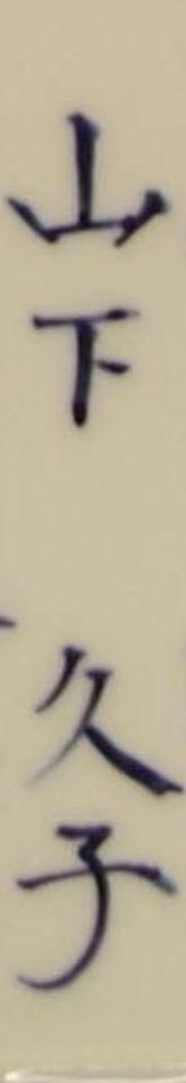山下久子
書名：A~D
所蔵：koyasan kongobuji
